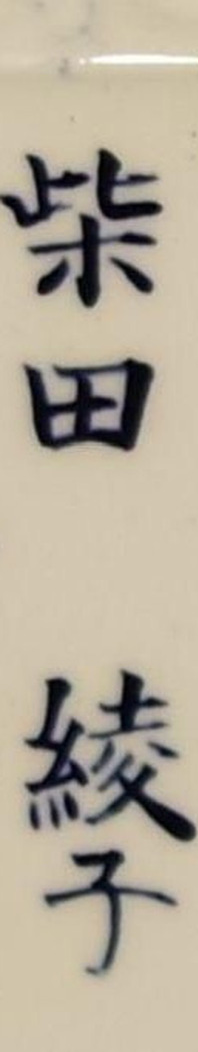柴田綾子
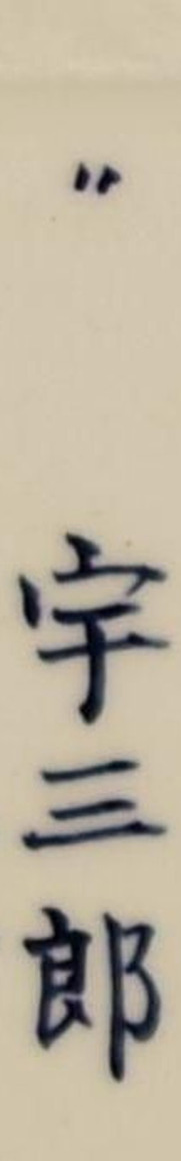宇三郎
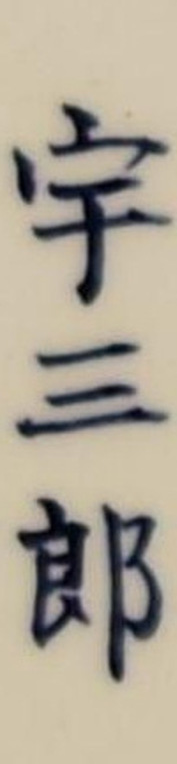宇三郎
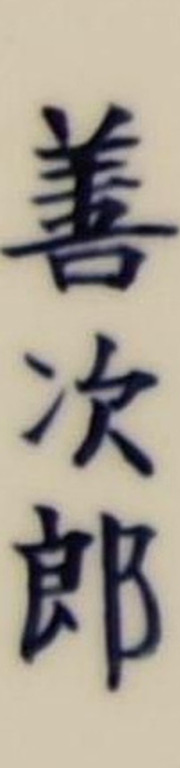善次郎
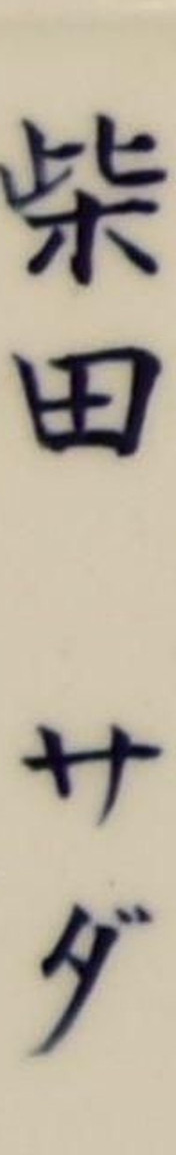柴田サダ
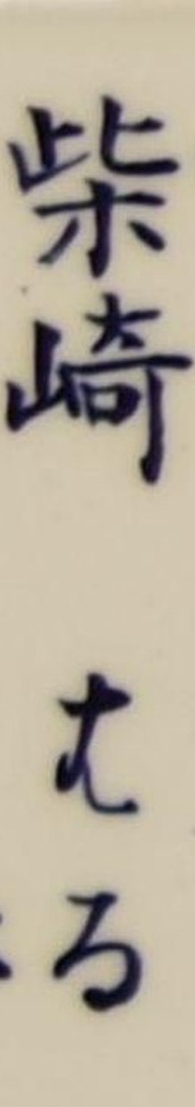紫崎はる
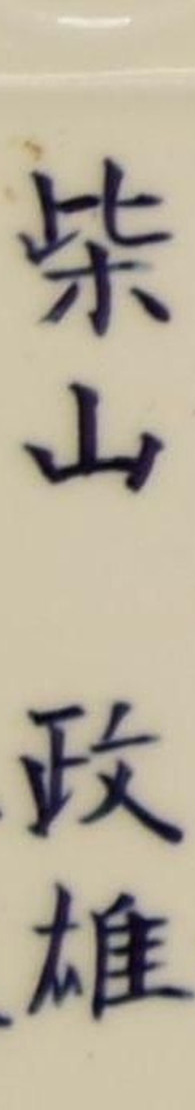柴山政雄

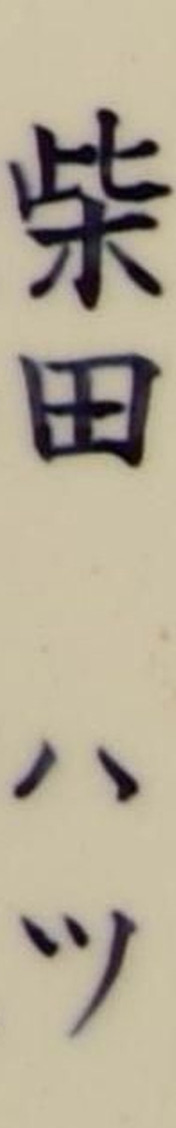柴田ハツ
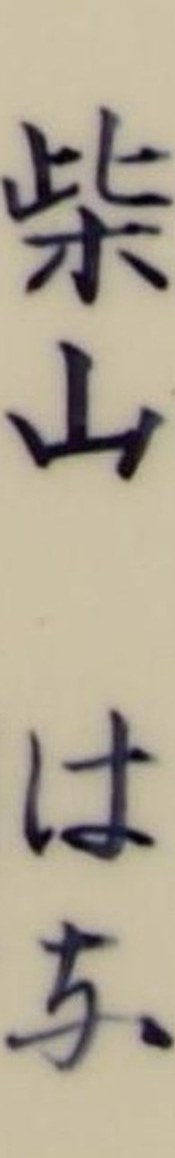柴山はな
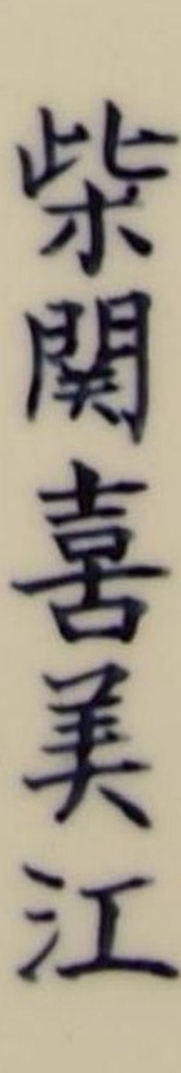柴関喜美江
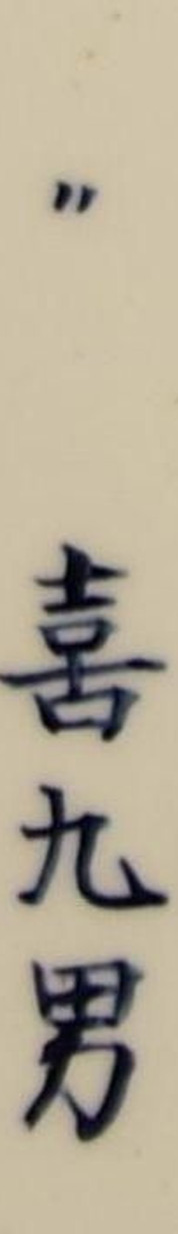喜九男
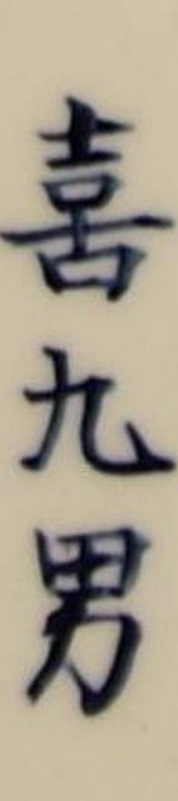喜九男
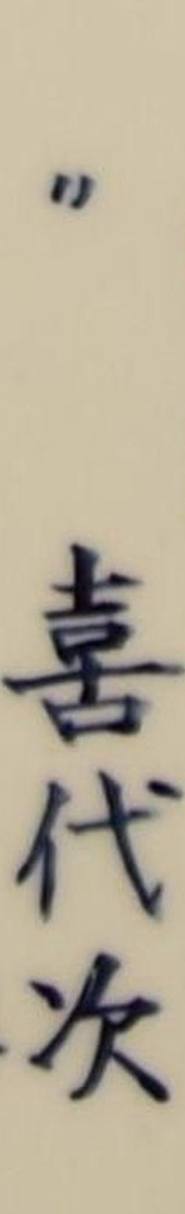喜代次
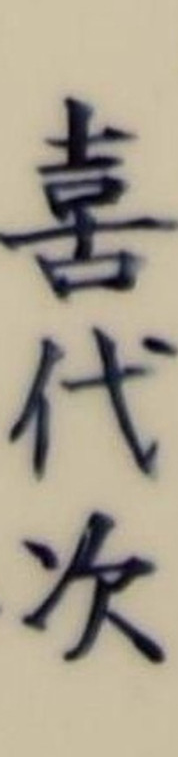喜代次
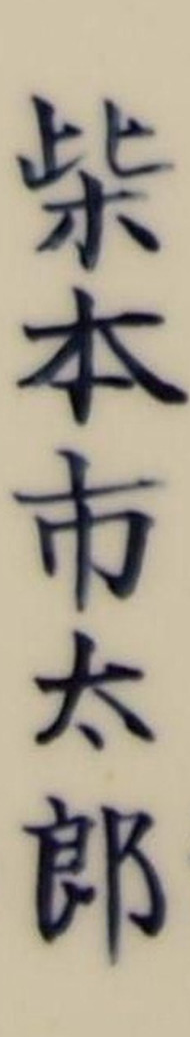柴本市太郎
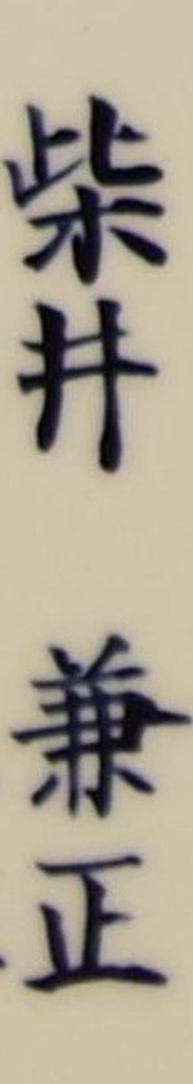柴井兼正
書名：A~D
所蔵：koyasan kongobuji
